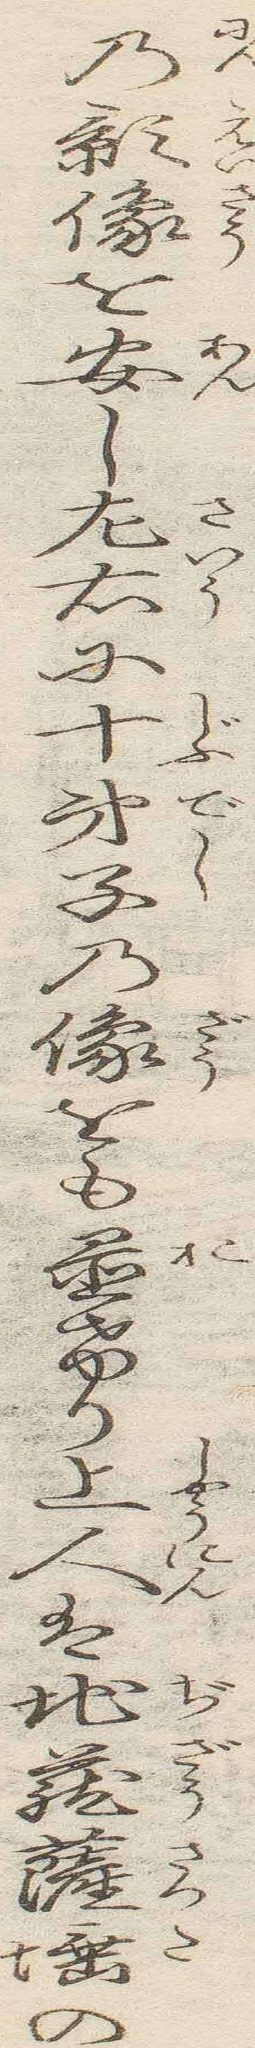の影像を安し左右に十㐧子の像をも置けり上人は地蔵薩埵の
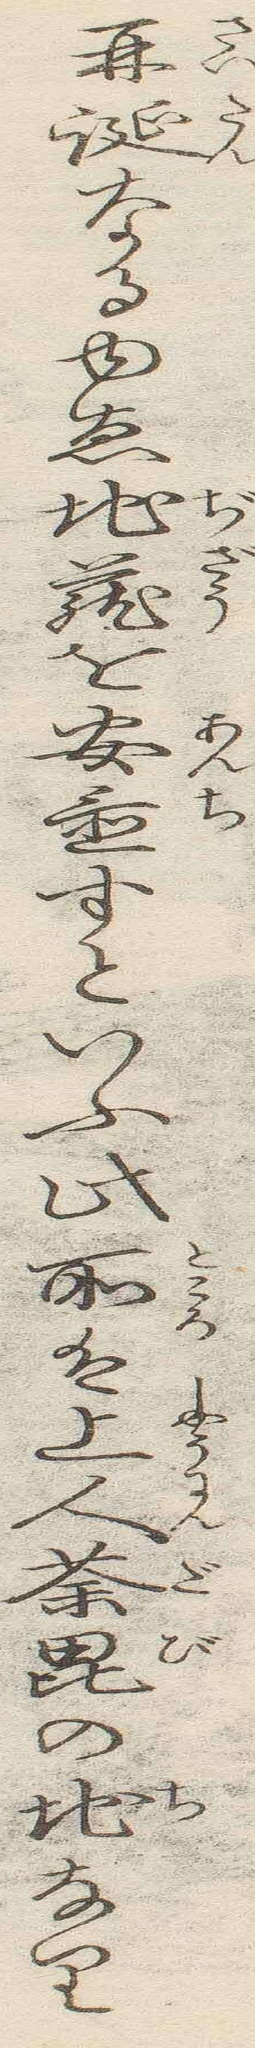再誕なるゆゑ地蔵を安置すといふ此所は上人荼毘の地なり
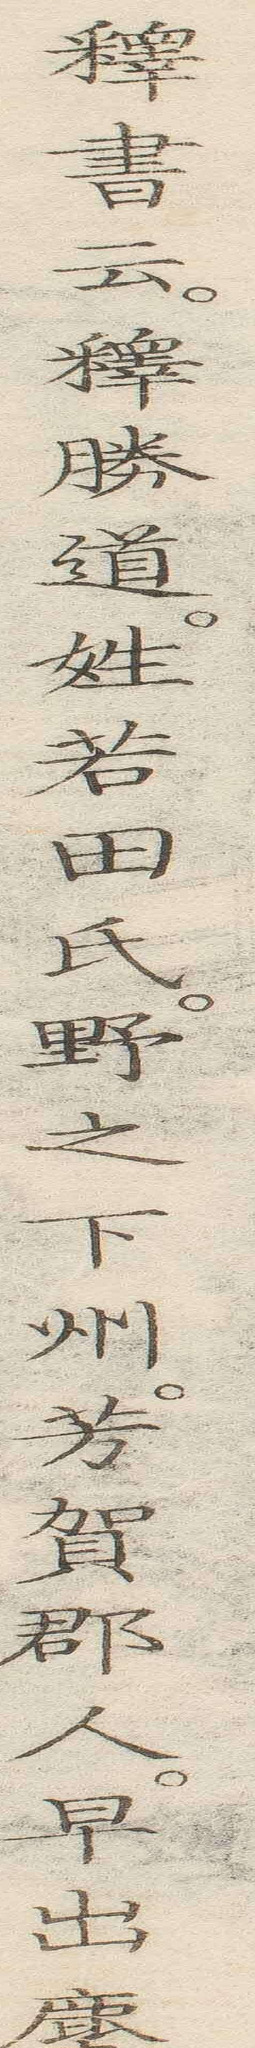釋書云。釋勝道。姓若田氏。野之下州。芳賀郡人。早出塵
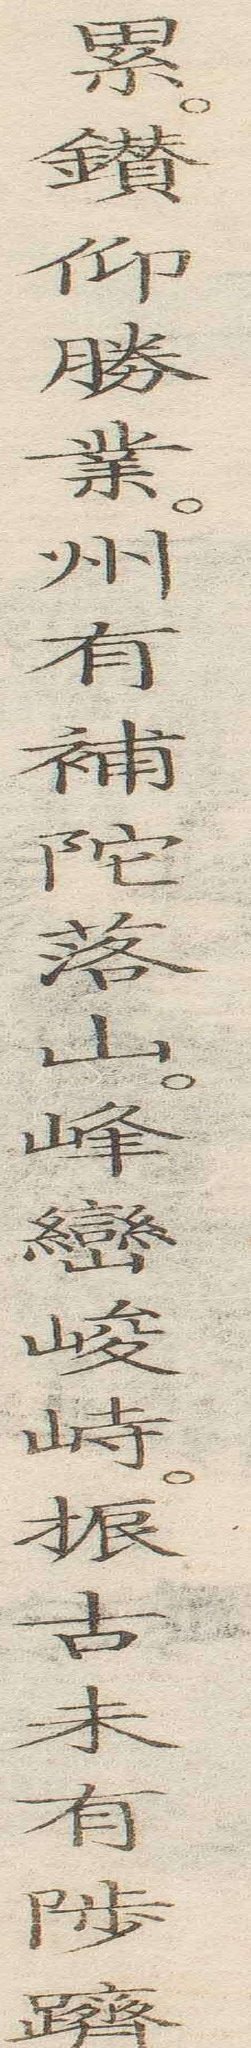累。鑚仰勝業。州有補陀落山。峰巒峻峙。振古未有陟躋
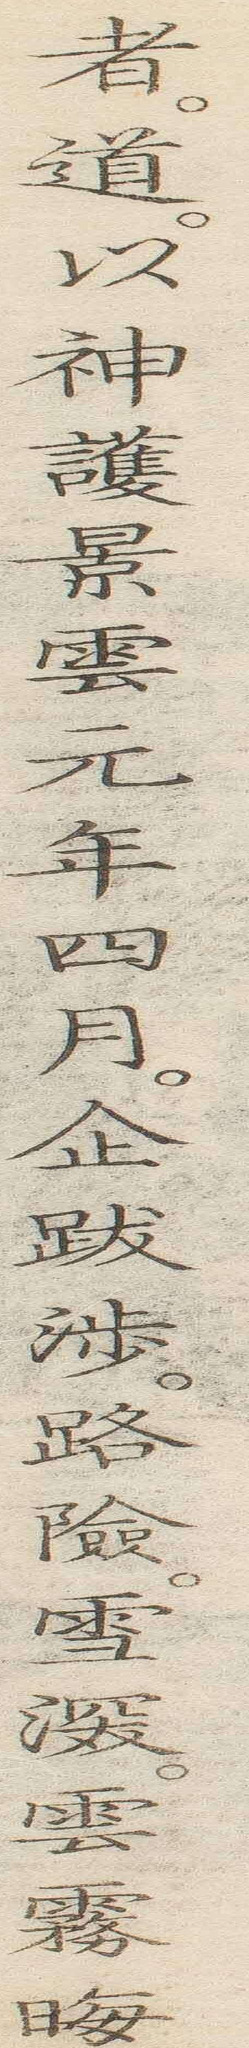者。道。以神護景雲元年四月。企跋涉。路險。雪㴱。雲霧晦
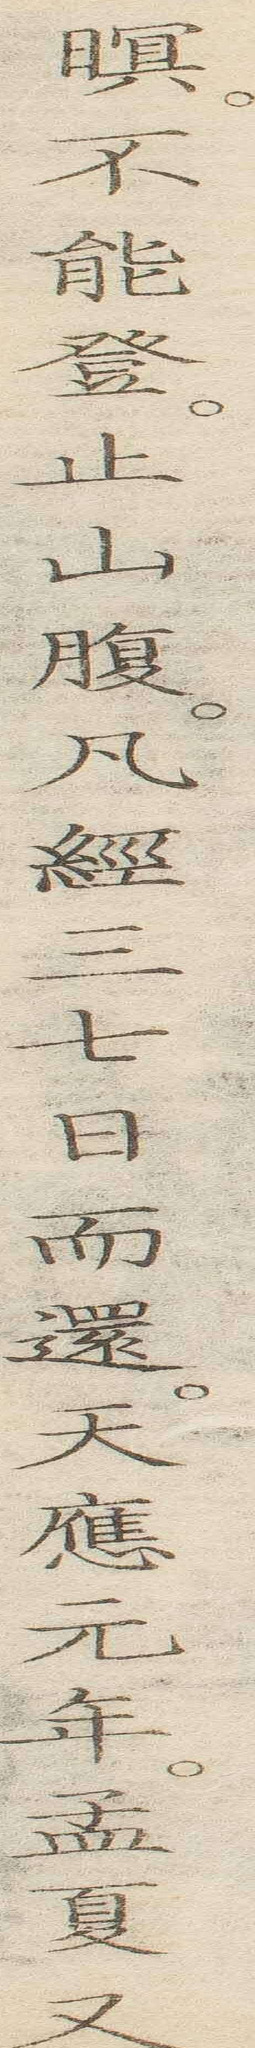暝。不能登。止山腹。凡經三七日而還。天應元年。孟夏又
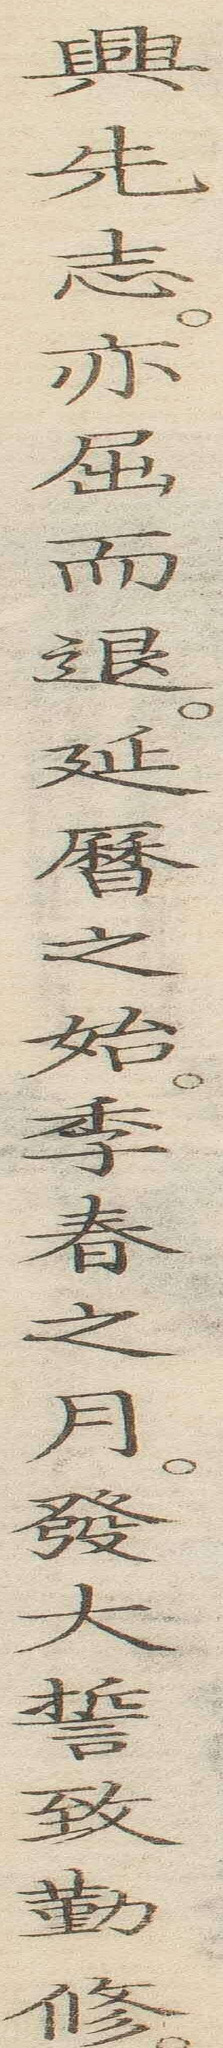興先志。亦屈而退。延曆之始。季春之月。發大誓致勤修。

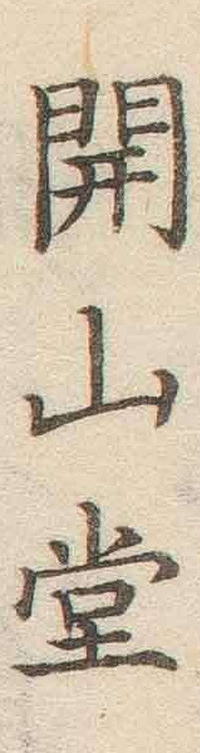開山堂
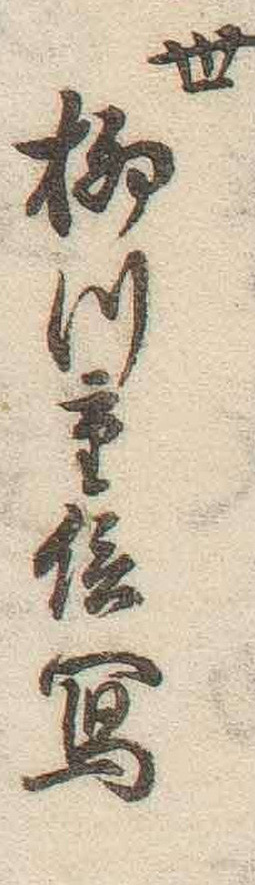柳川重信冩

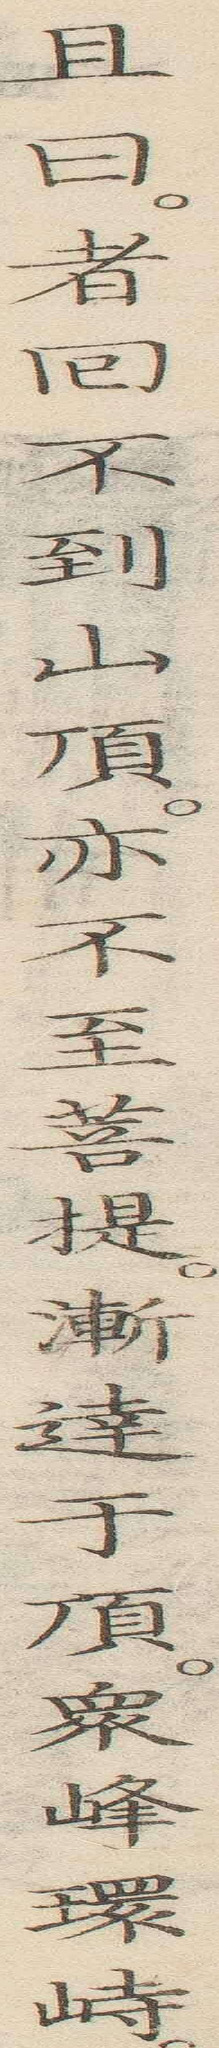且曰。者囘不到山頂。亦不至菩提。漸達于頂。衆峰環峙。
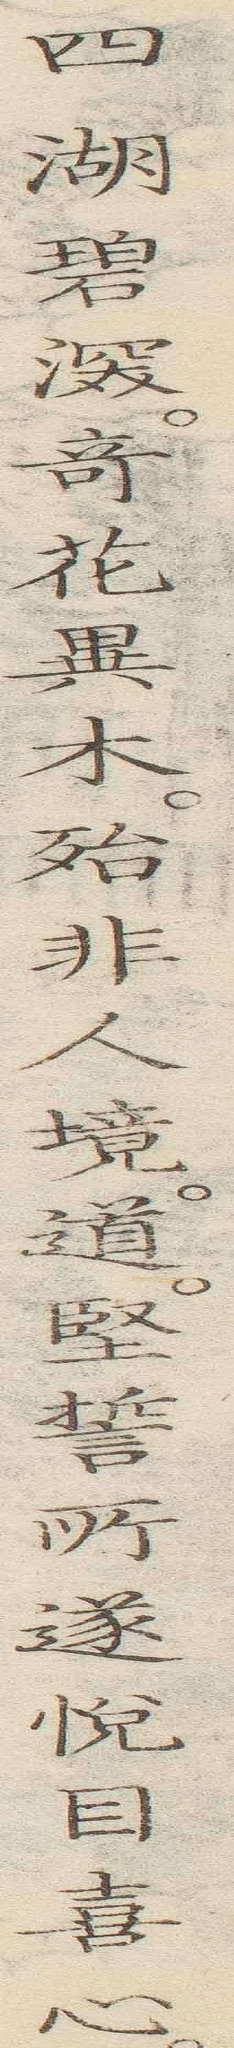四湖碧㴱。竒花異木。殆非人境。道。堅誓所遂悅目喜心。
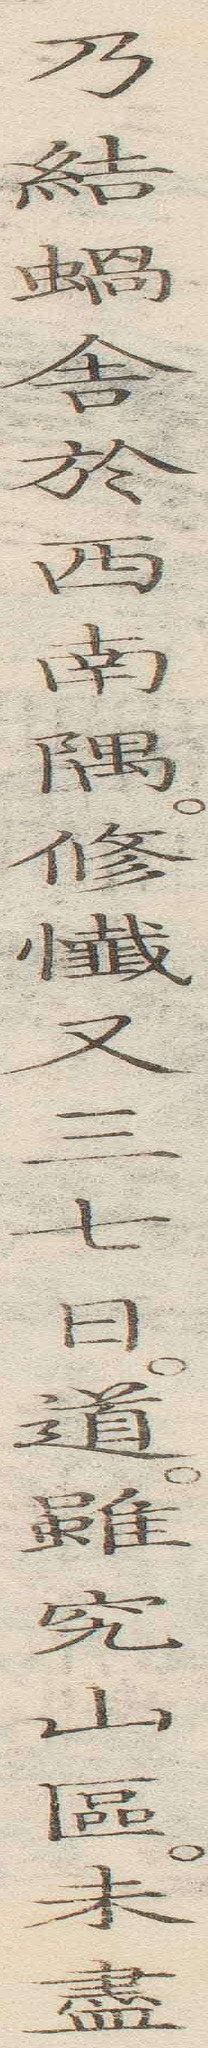乃結蝸舎於西南隅。修懴又三七日。道。雖究山區。未盡
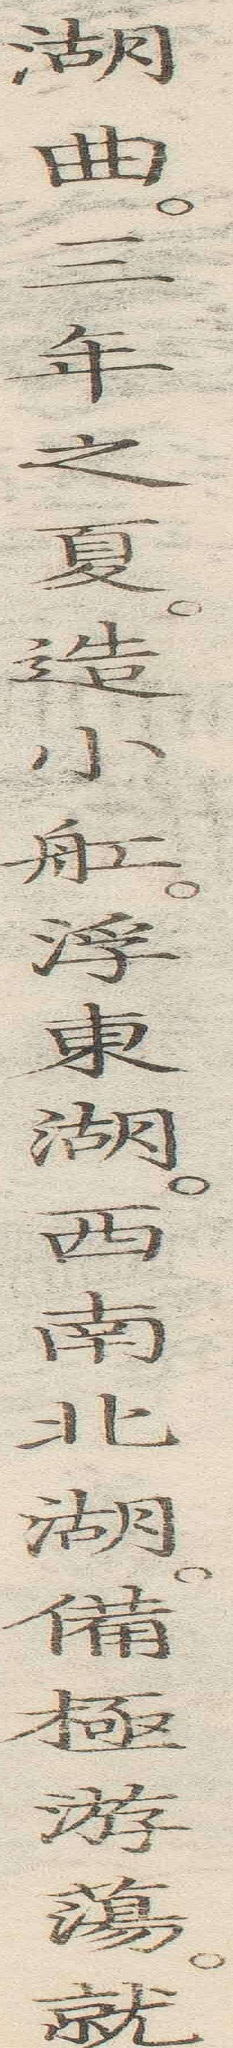湖曲。三年之夏。造小舡。浮東湖。西南北湖。備極游蕩。就
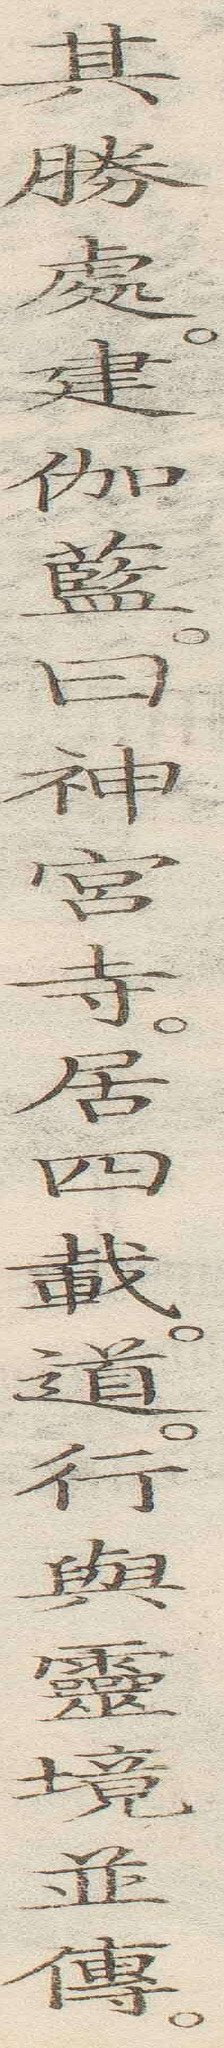其勝處。建伽藍。曰神宮寺。居四載。道。行與靈境並傳。
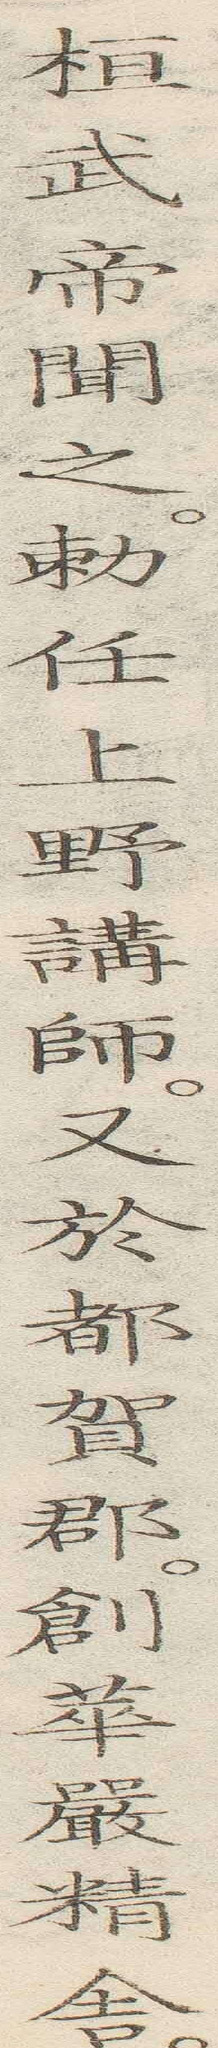桓武帝聞之。勅任上野講師。又於都賀郡。創蕐嚴精舎。
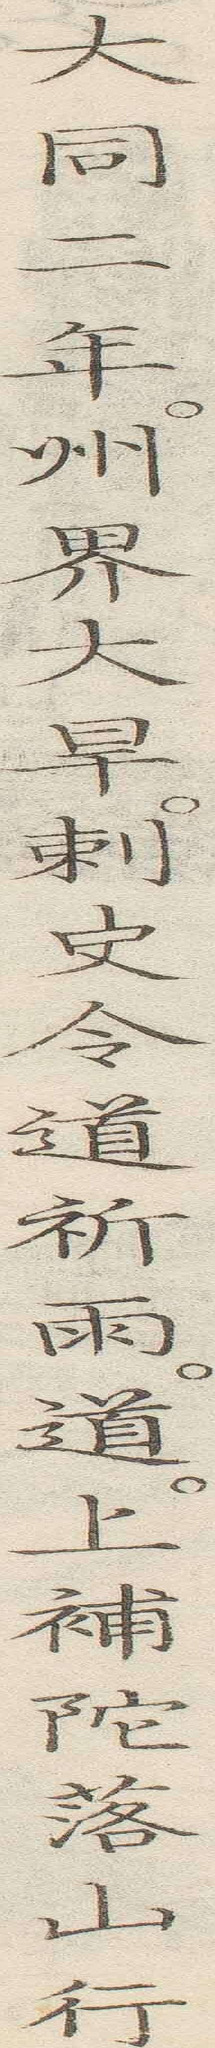大同二年。州界大旱。剌史令道祈雨。道。上補陀落山行
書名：日光山志
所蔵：東京学芸大学附属図書館 国文学研究資料館
